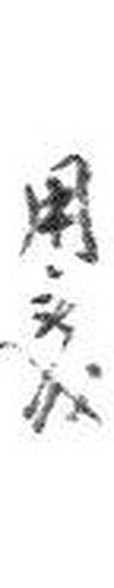用被成
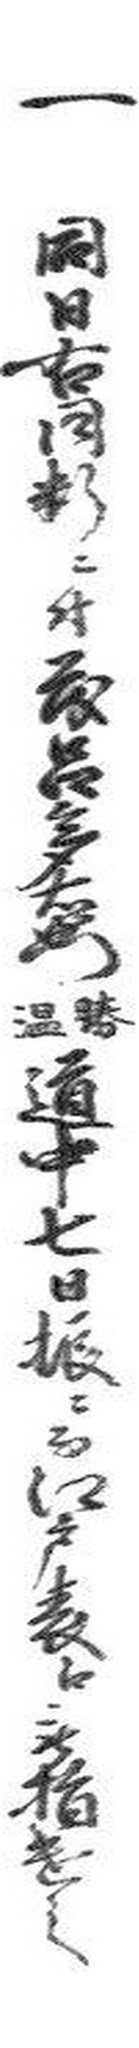一同日右同断ニ付茂呂多右衛門勝温道中七日振ニ而江戸表江被指遣之
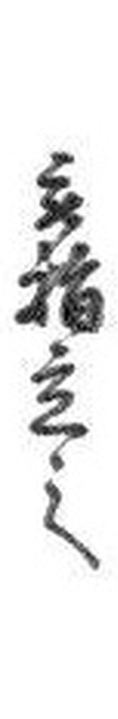被指立之
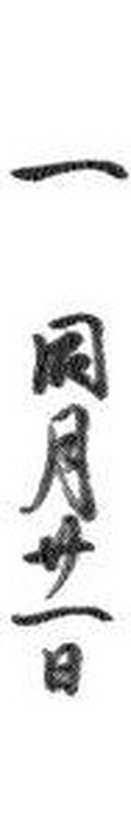一同月廿一日
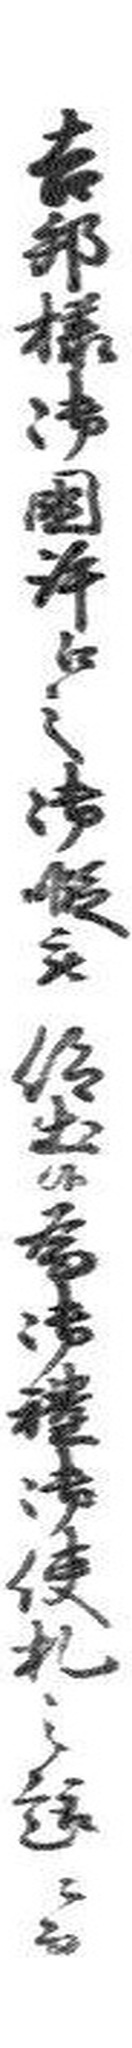吉邦様御国許江之御暇被仰出候為御礼御使札之趣ニ而
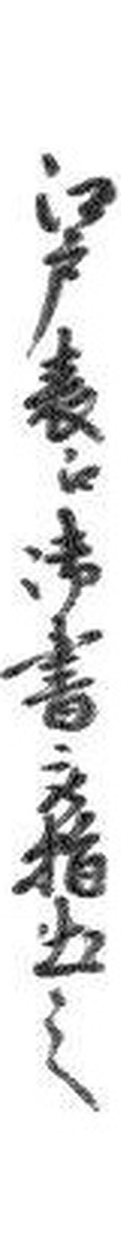江戸表江御書被指出之
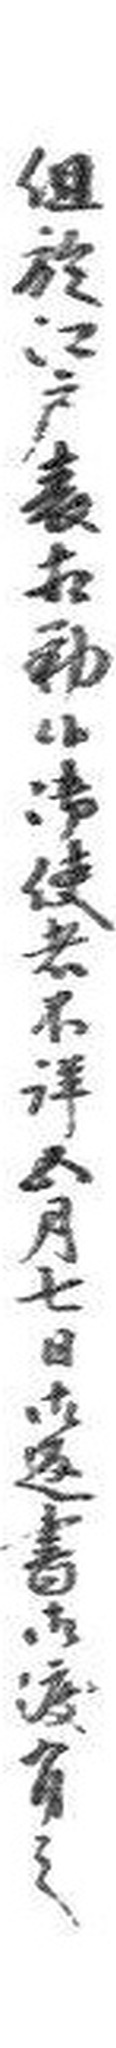但於江戸表相勤候御使者不詳五月七日御返書御渡有之
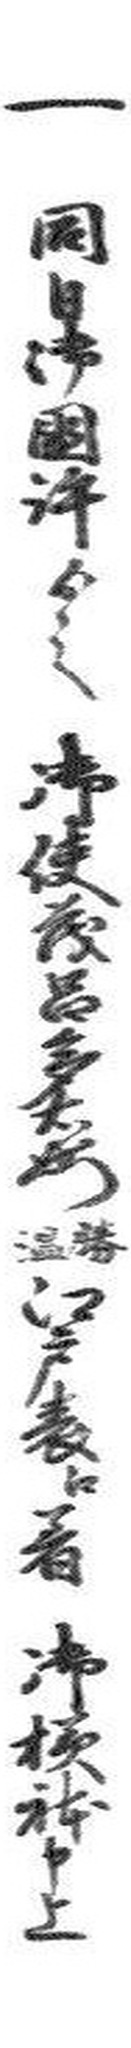一同日国許ゟ之御使茂呂多右衛門勝温江戸表江着御様体申上
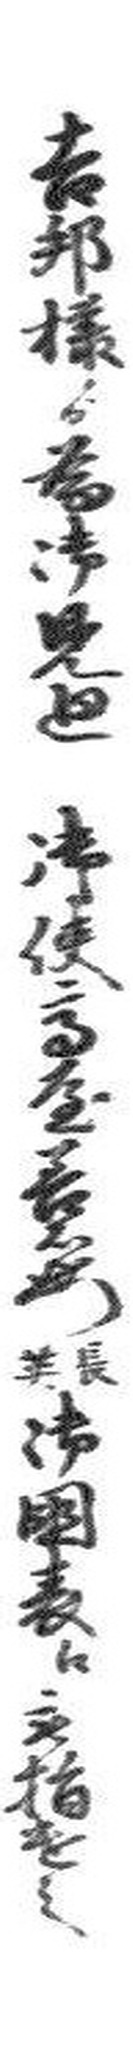吉邦様ゟ為御見廻御使高屋善右衛門長英御国表江被指遣之

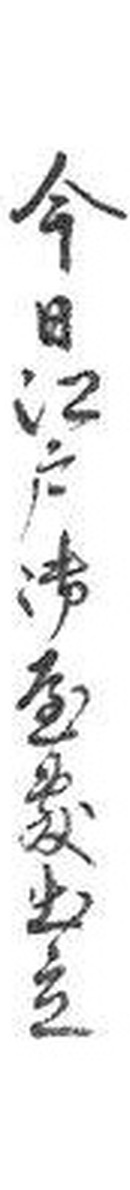今日江戸御屋敷出立
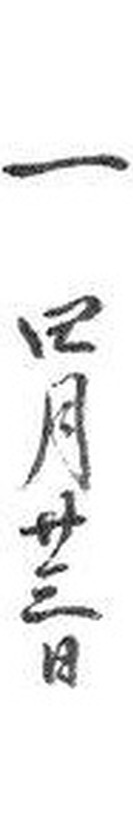一四月廿三日
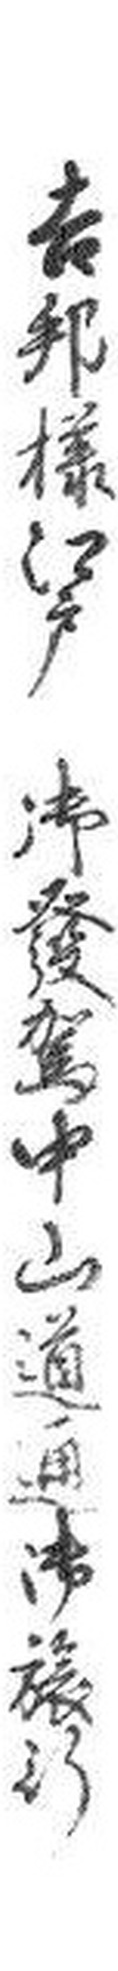吉邦様江戸御発駕中山道通御旅行
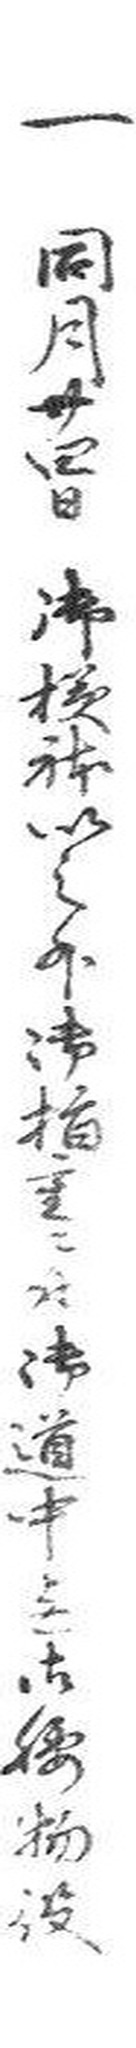一同月廿四日御様体以之外御指重ニ付御道中迄御腰物役
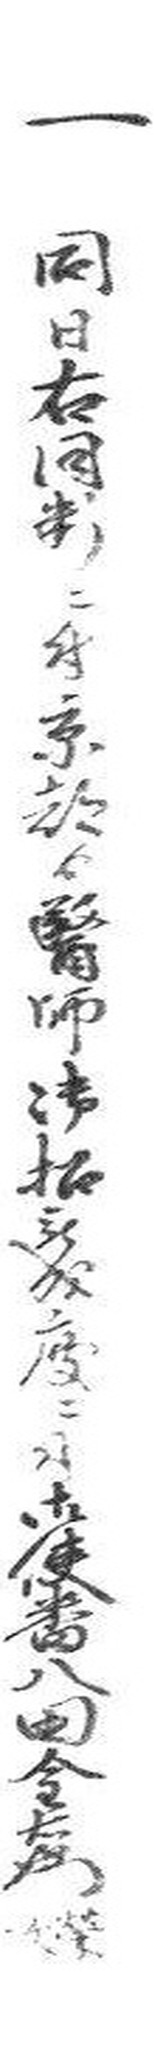一同日右同断ニ付京都ゟ医師御招被成度ニ付御使番八田金右衛門栄次
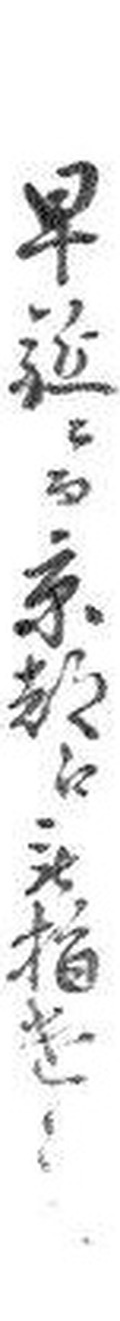早駆ニ而京都江被指遣之
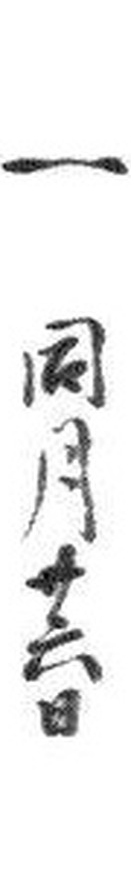一同月廿六日
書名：家譜 二十六 吉品公 従宝永七年到正徳二年
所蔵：福井県文書館 Fukui Prefectural Archives
